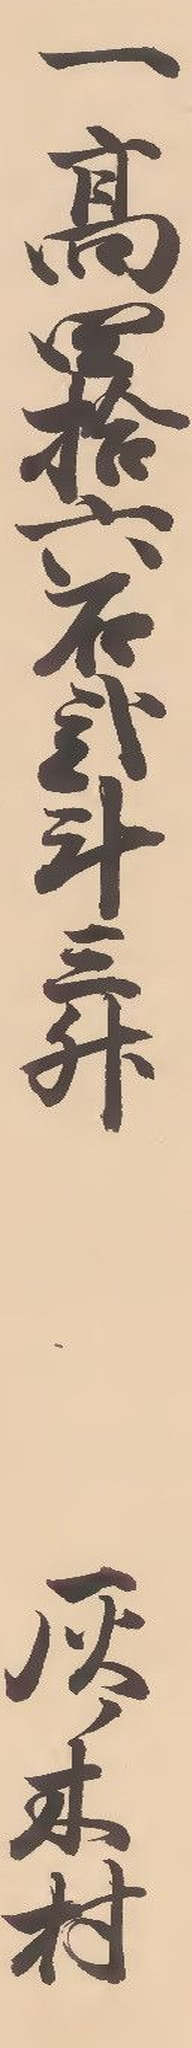一高四拾六石弐斗三升灰ノ木村
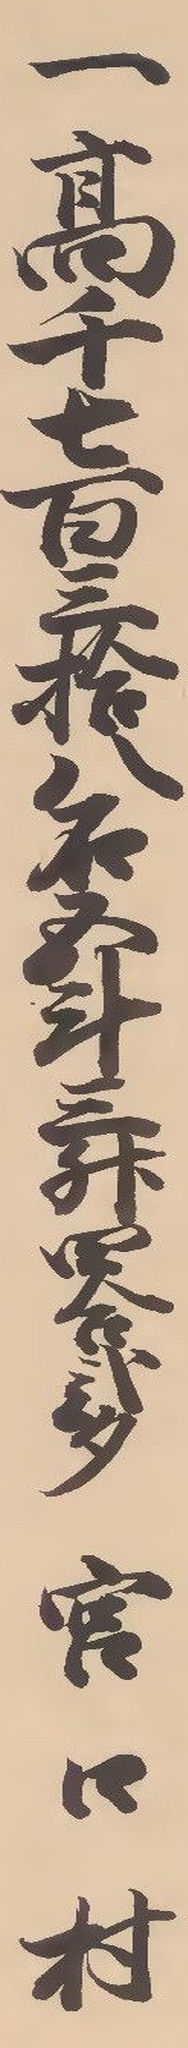一高千七百三拾八石五斗三升四合弐勺宮口村
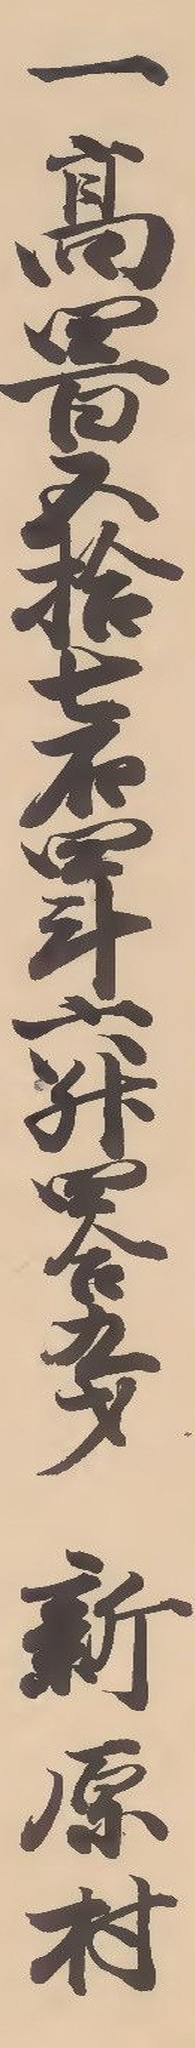一高四百五拾七石四斗六升四合九才新原村
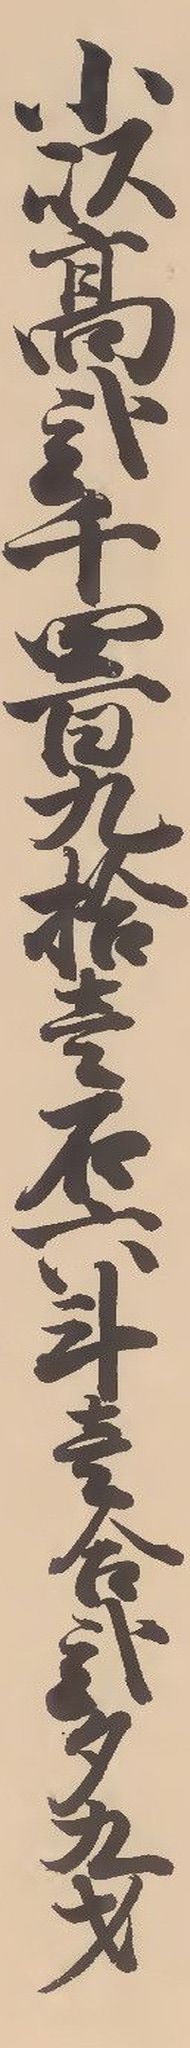小以高弐千四百九拾壱石六斗壱合弐勺九才

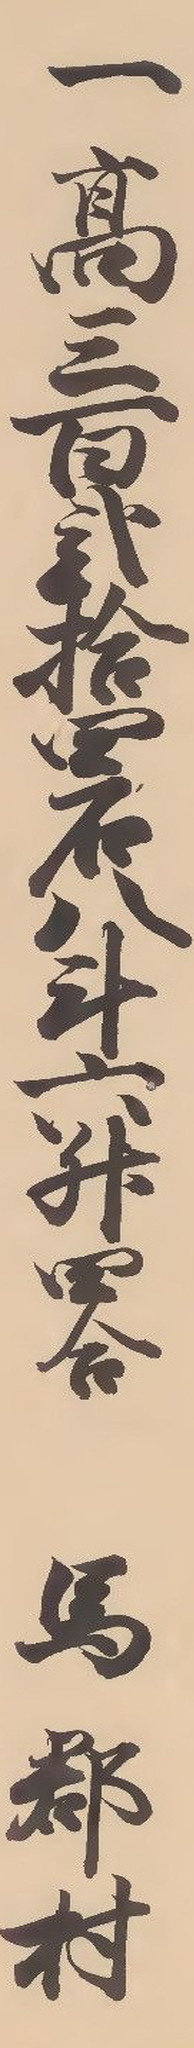一高三百弐拾四石八斗六升四合馬郡村
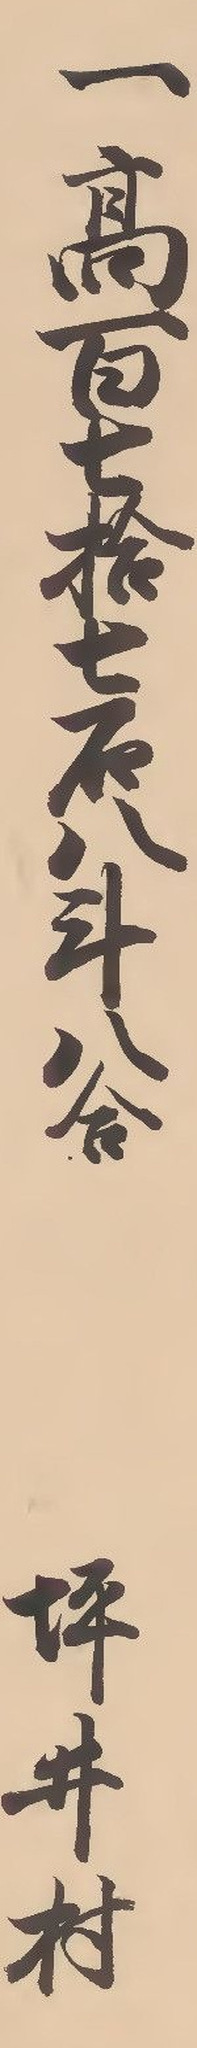一高百七拾七石八斗八合坪井村
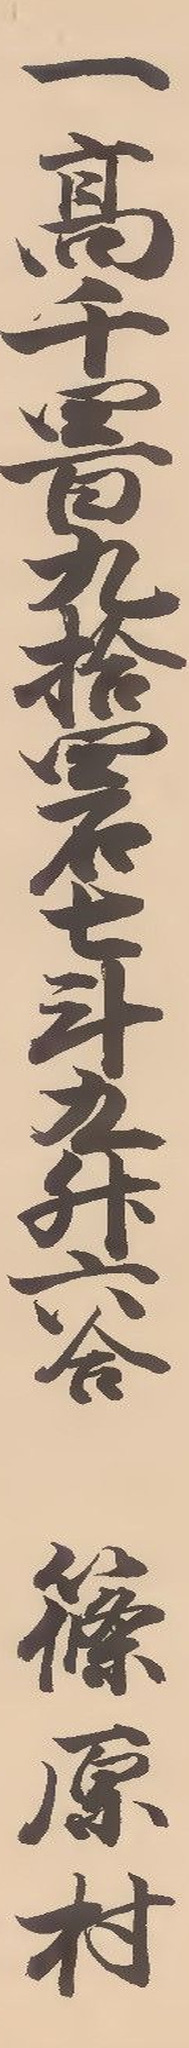一高千四百九拾四石七斗九升六合篠原村
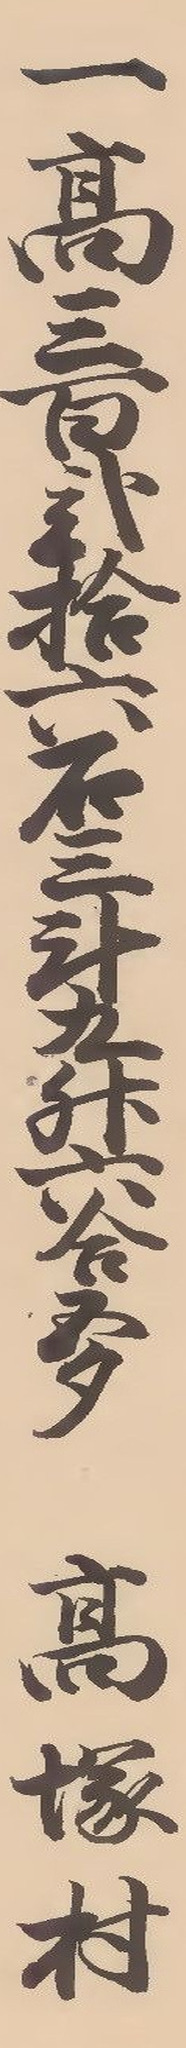一高三百弐拾六石三斗九升六合五勺高塚村
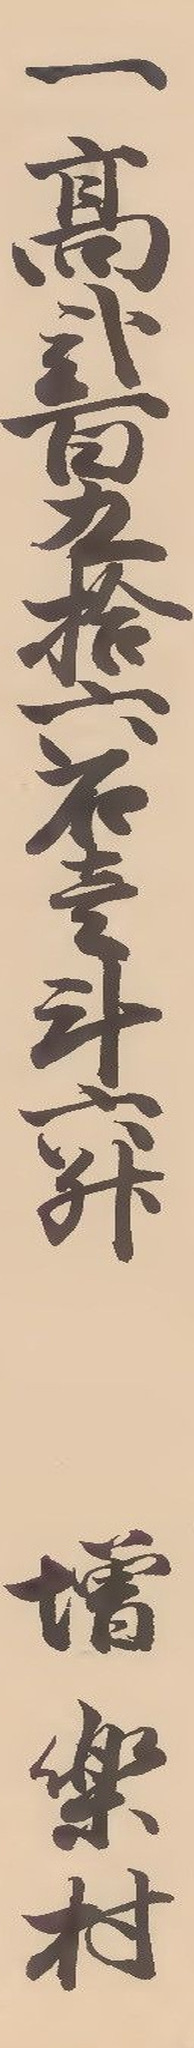一高弐百九拾六石壱斗六升増楽村
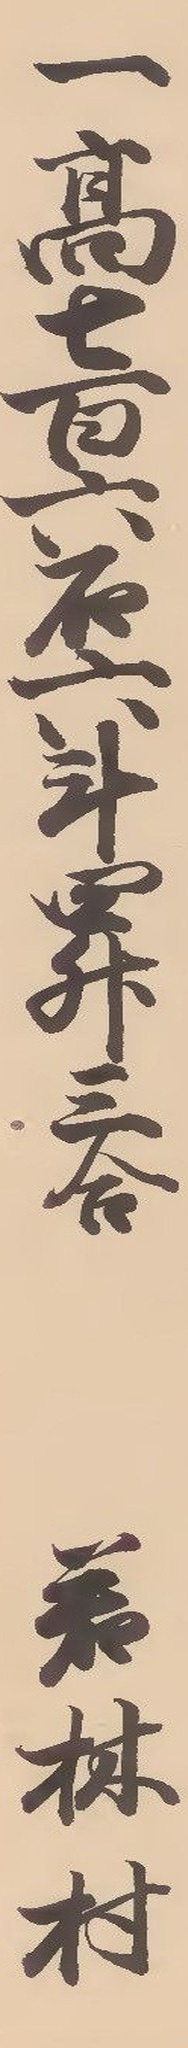一高七百六石六斗四升三合若林村

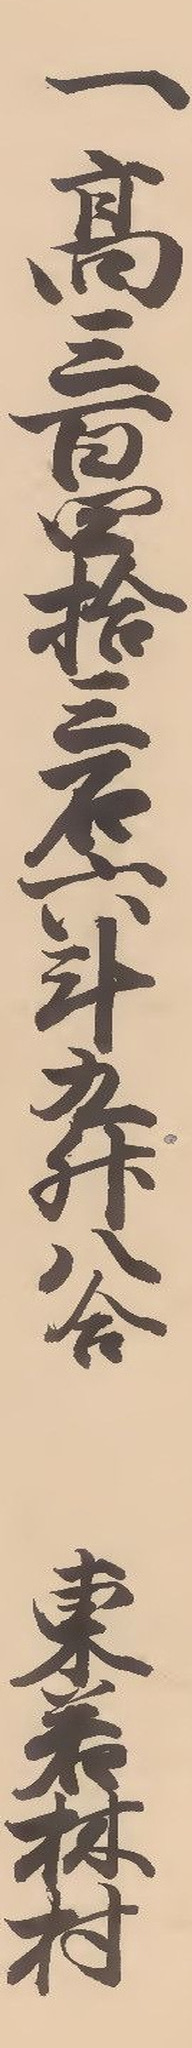一高三百四拾三石六斗九升八合東若林村
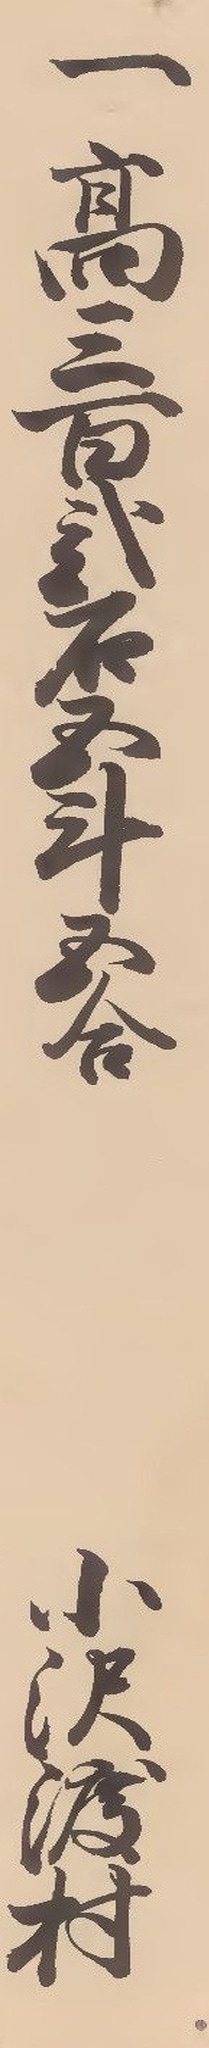一高三百弐石五斗五合小沢渡村
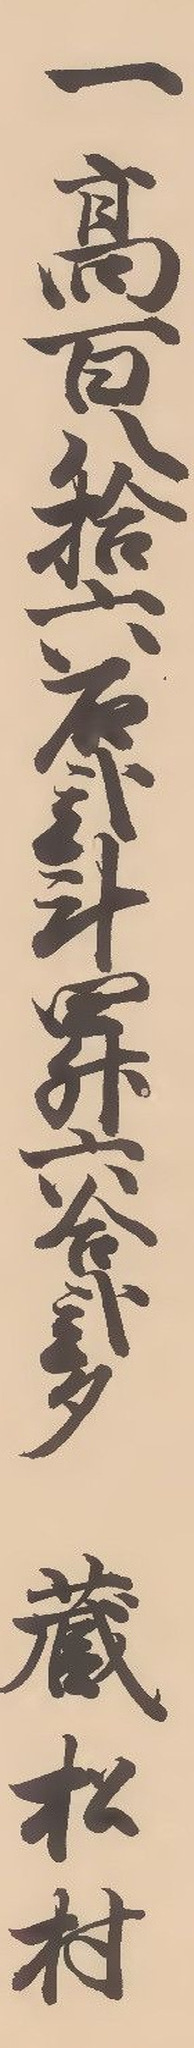一高百八拾六石弐斗四升六合弐勺蔵松村
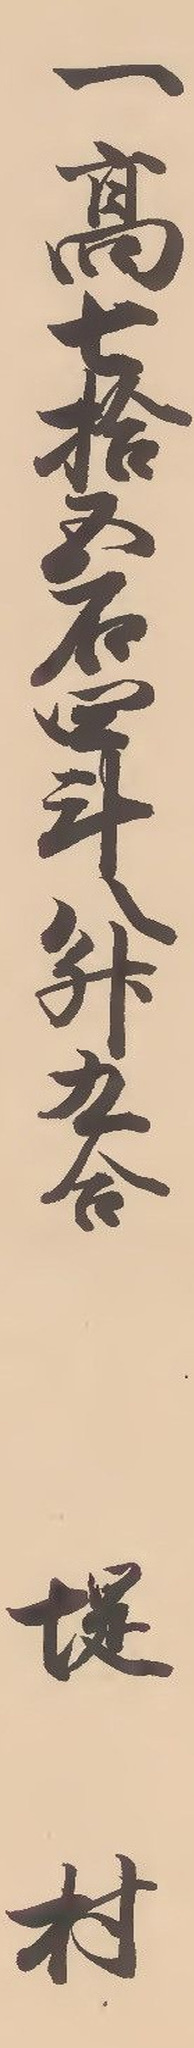一高七拾五石四斗八升九合堤村
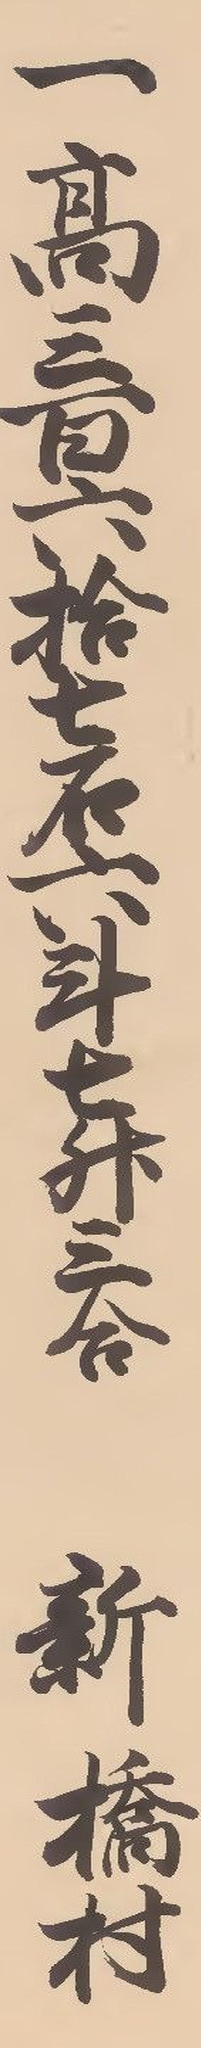一高三百六拾七石六斗七升三合新橋村
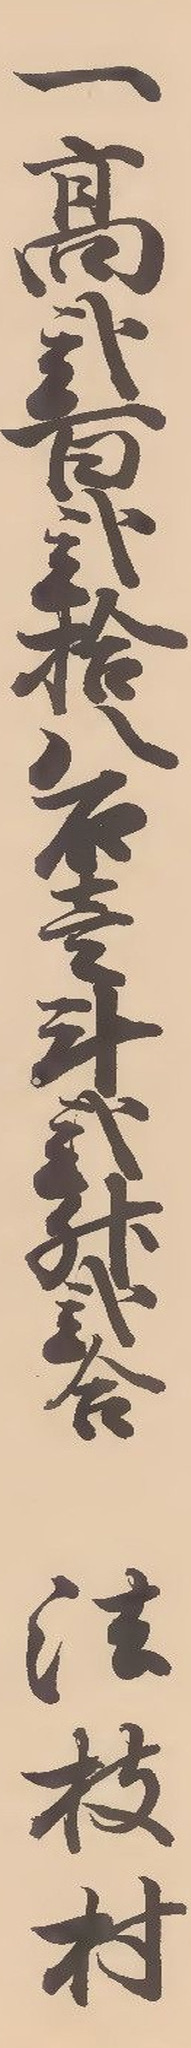一高弐百弐拾八石壱斗弐升弐合法枝村
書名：遠江国郷帳
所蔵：国立公文書館 National Archives of Japan
